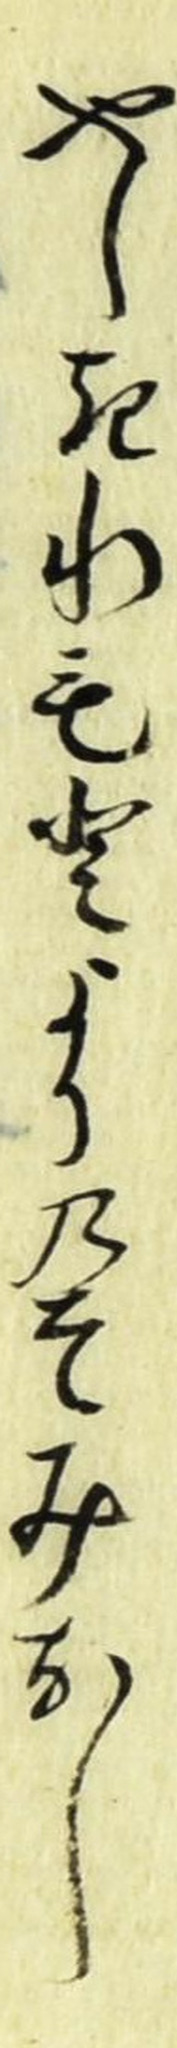やしきわもとよりのそみなし
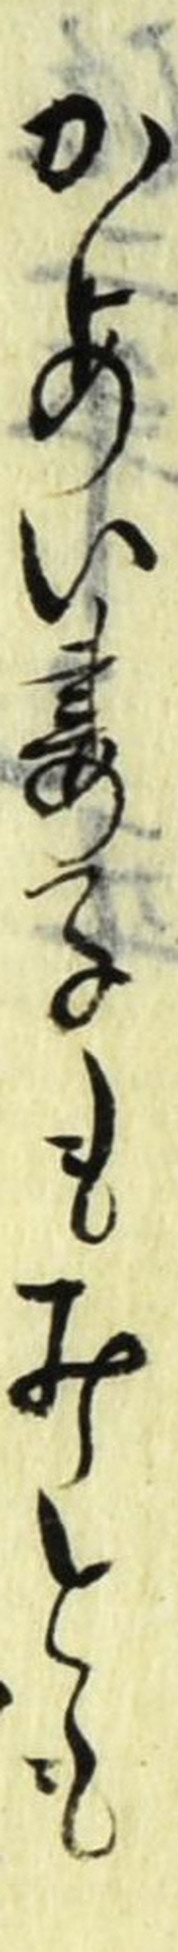かあい妻子もみとも

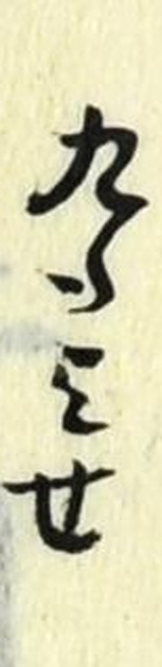九ツとせ
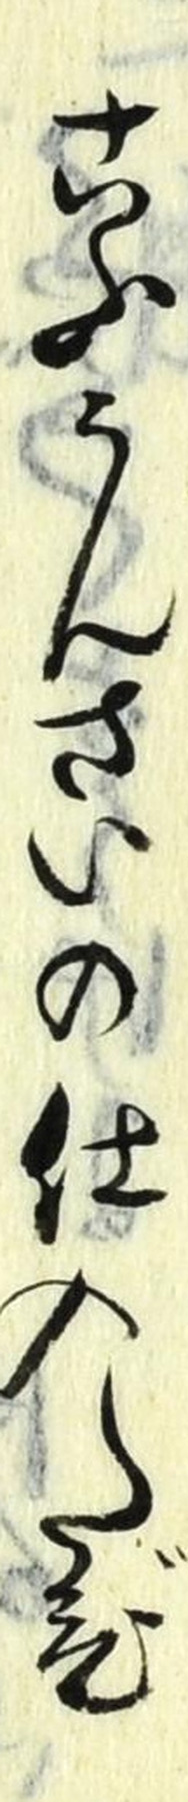こふうんさいの仕入たび
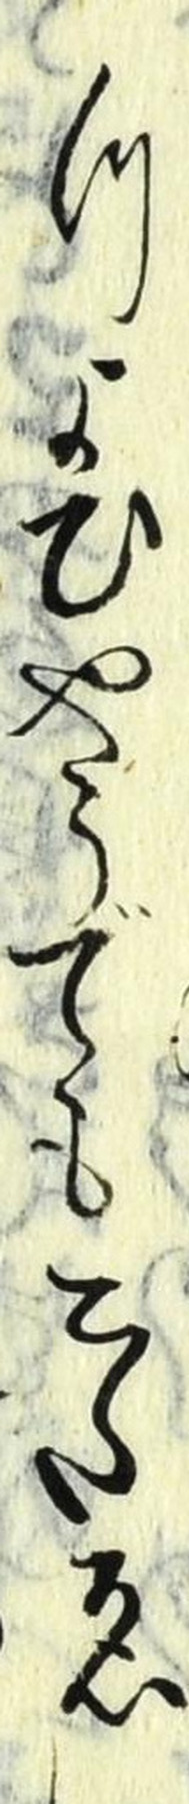つよひやうでもとたゑ
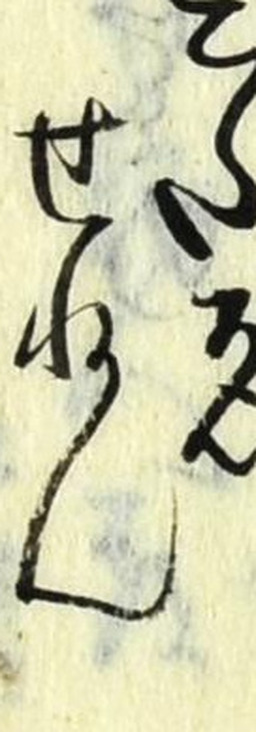せねん
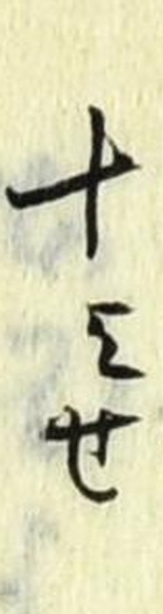十とせ
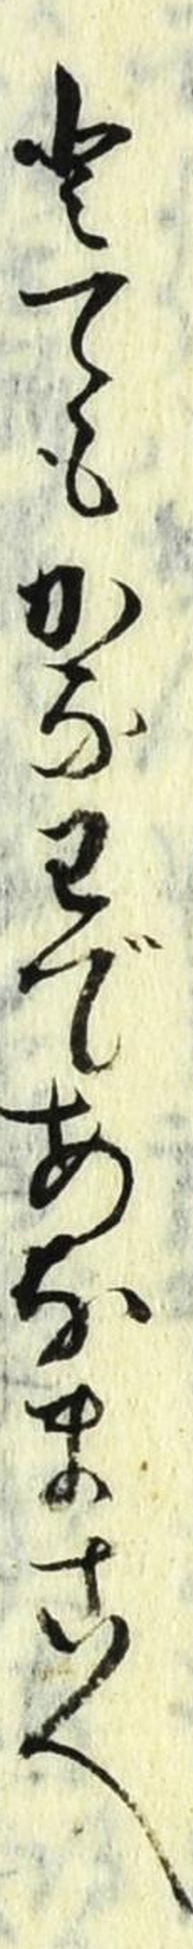とてもかなわであなまこへ
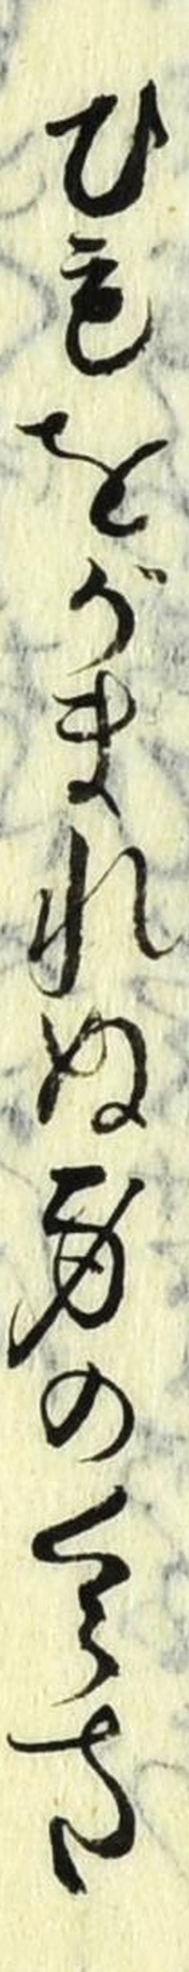ひもをがまれぬ身のくらさ
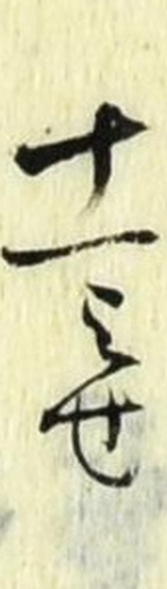十一とせ
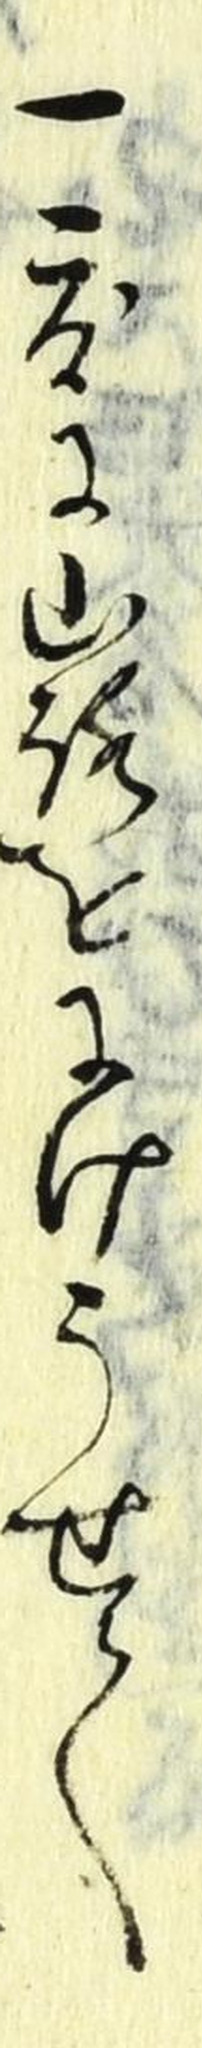一度に山路をにけうせて
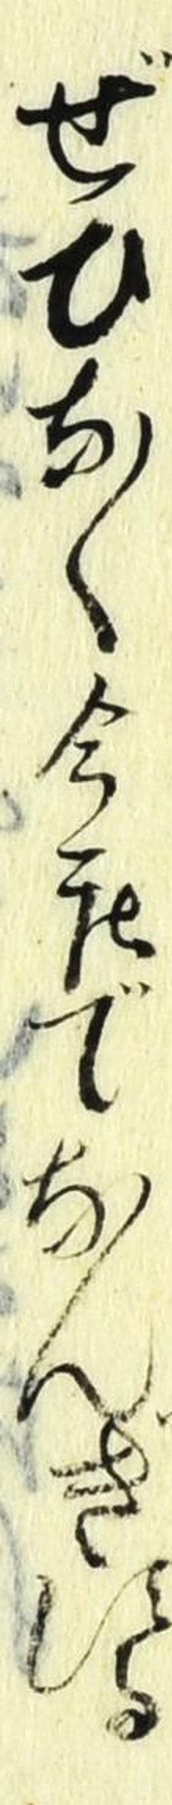ぜひなく今庄でなんぎする
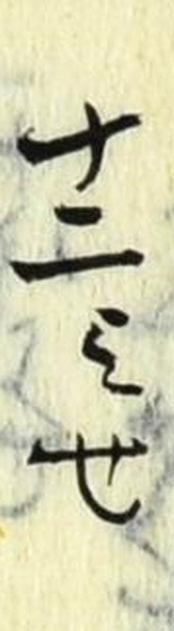十二とせ
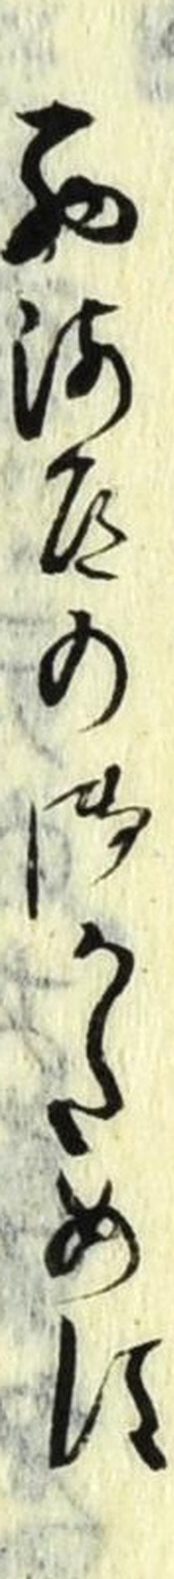西海道の御かためは
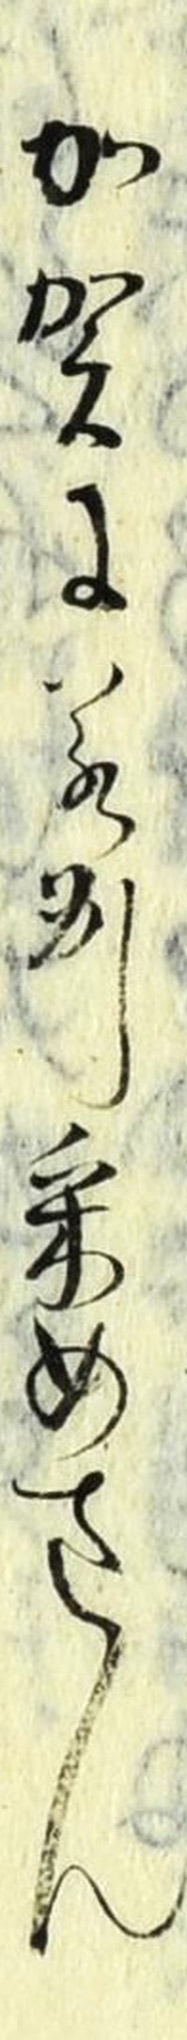加賀に若州采女さん
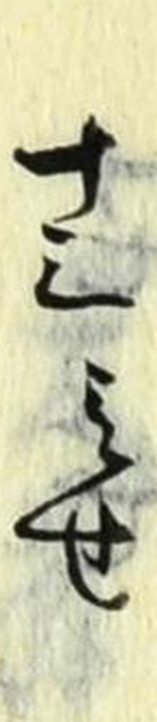十三とせ
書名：（日記）
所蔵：福井県文書館 Fukui Prefectural Archives
